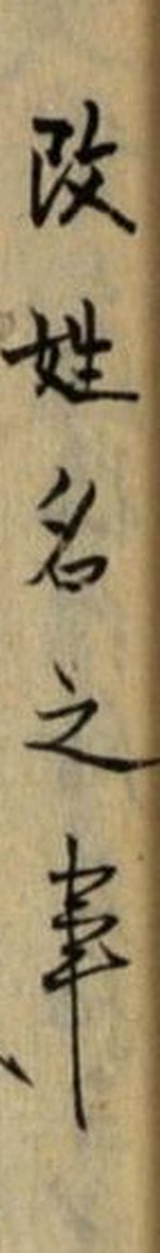改姓名之事
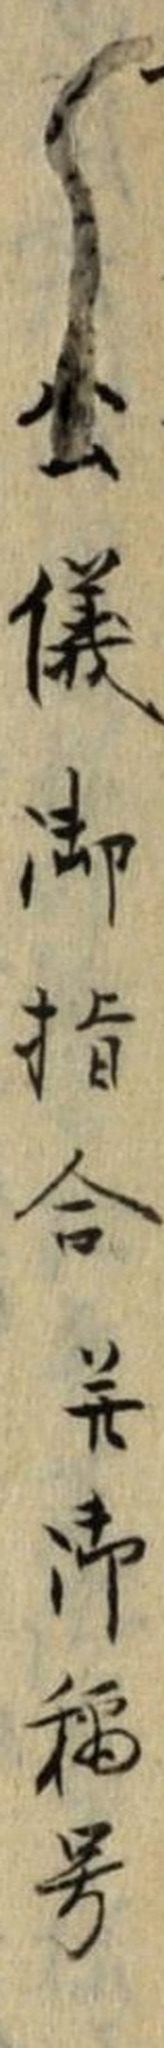公儀御指合并御称号
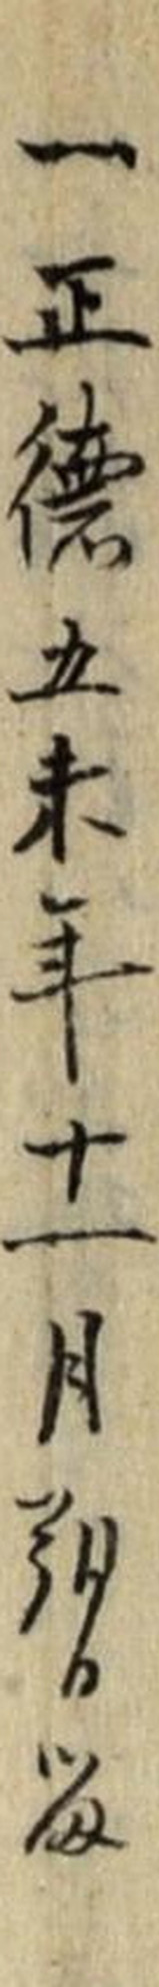一正徳五未年十一月朔日留
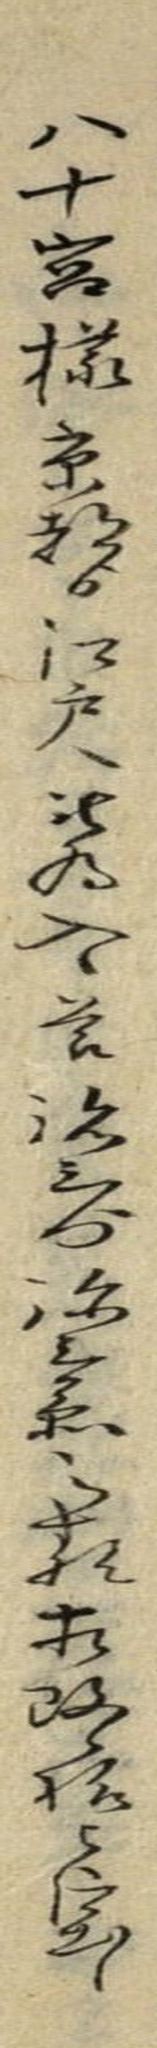八十宮様京都ゟ江戸へ被為入候節弥三右衛門弥三兵衛之類相改候様被仰出候
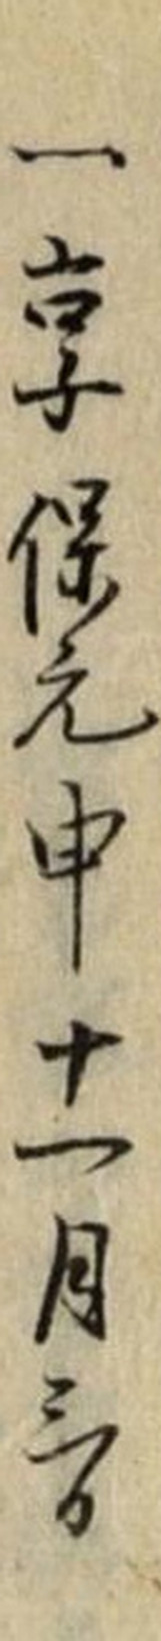一享保元申十一月三日
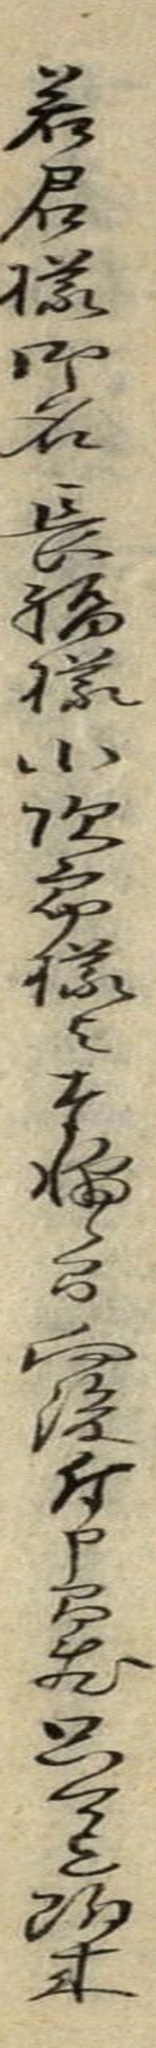若君様御名長福様小次郎様と奉称候間向後付申間敷只今迄附来
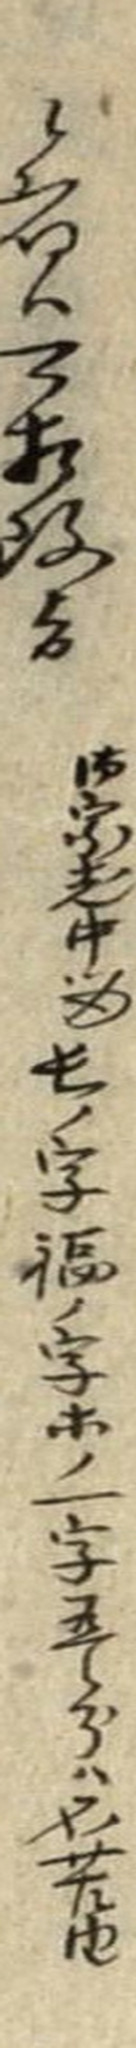候者は可相改旨御家老中留長ノ字福ノ字等一字有之分は不苦由
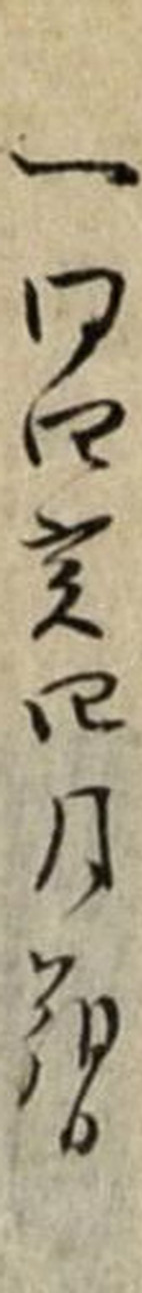一同四亥四月朔日
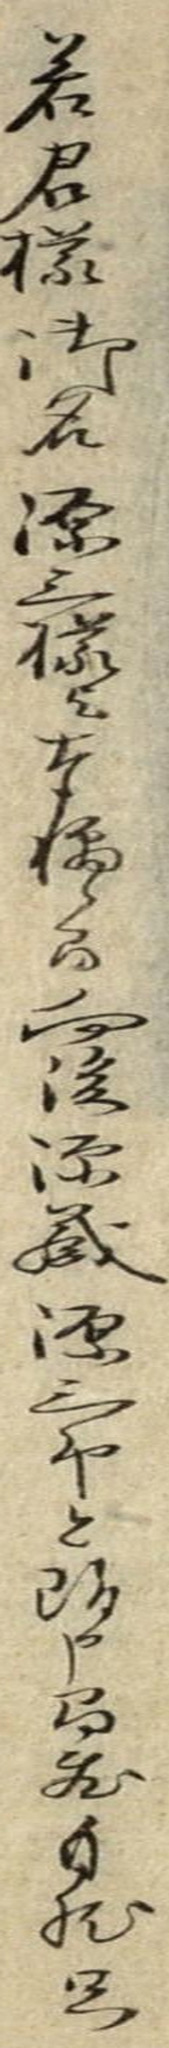若君様御名源三様と奉称候間向後源蔵源三郎と附申間敷自然只
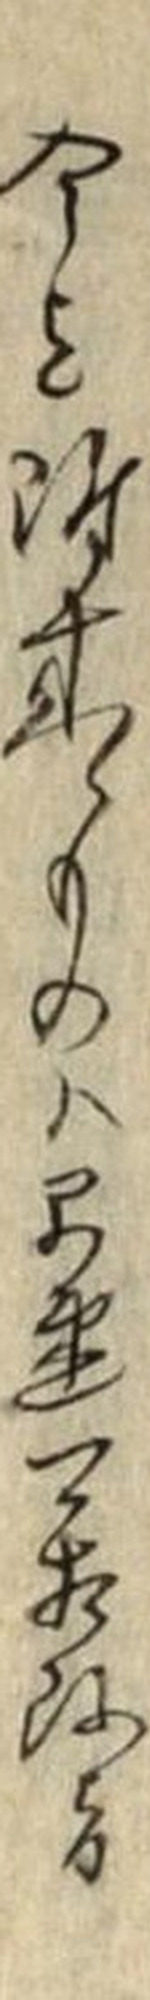今迄附来候ものは早速可相改旨
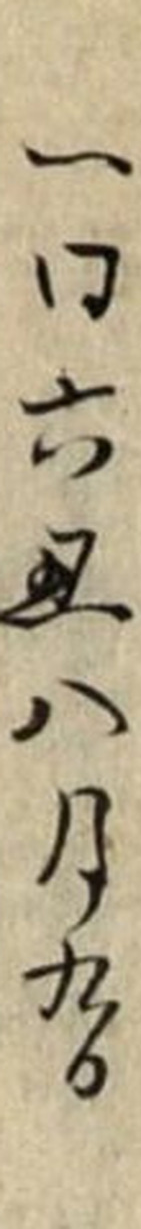一同六丑八月九日
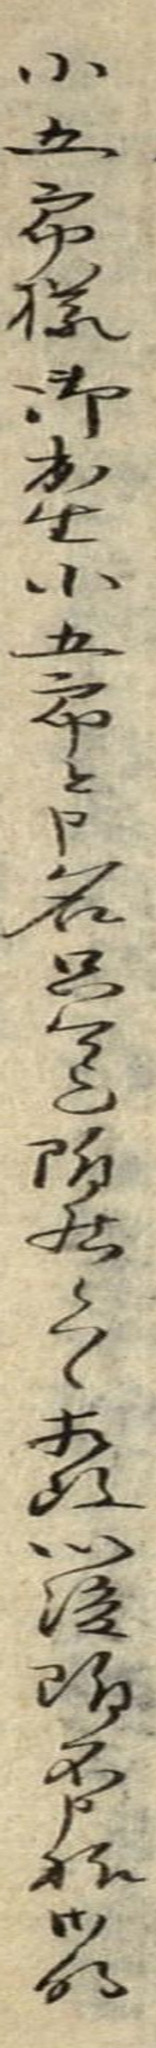小五郎様御出生小五郎と申名只今迄附居候はゝ相改以後附不申様御触
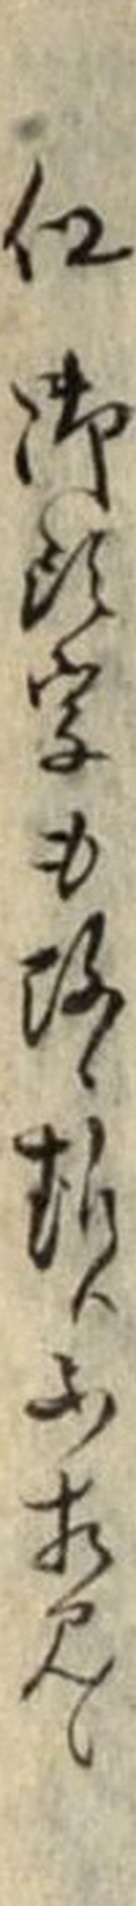但御頭字も改候趣は不相見候
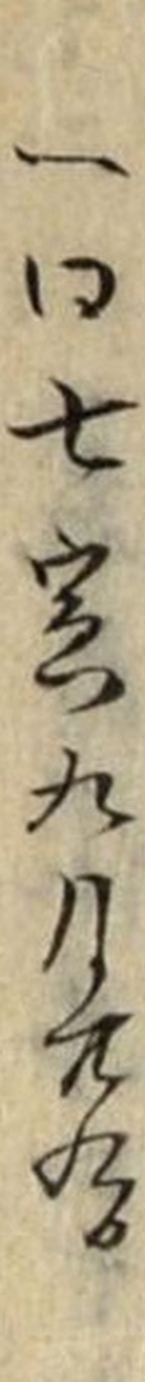一同七寅九月廿九日
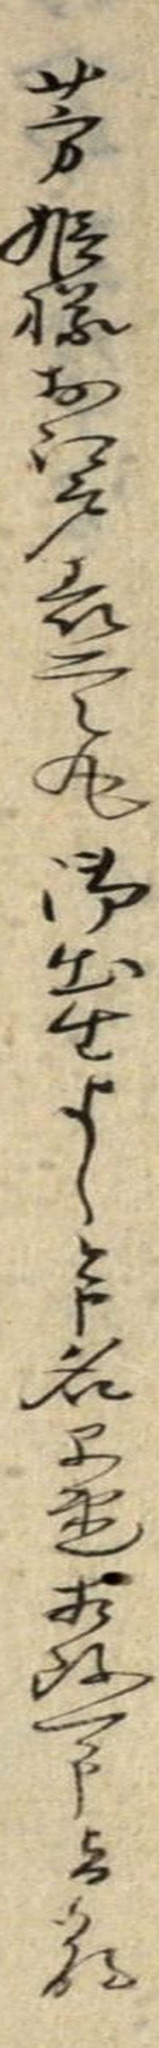芳姫様於江戸表二之丸御出生よしと申名早速相改可申旨御触

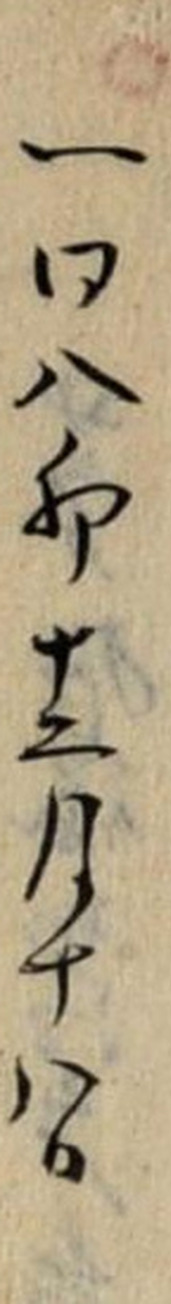一同八卯十二月十八日
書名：蒐輯之部
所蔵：福井県文書館 Fukui Prefectural Archives
